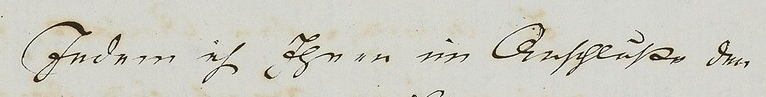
Indem ich Ihnen im Anschluße den
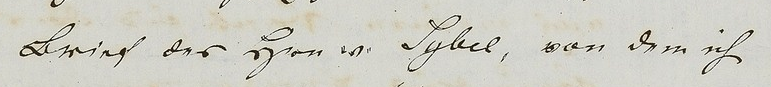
Brief des Hrn. v. Sybel, von dem ich
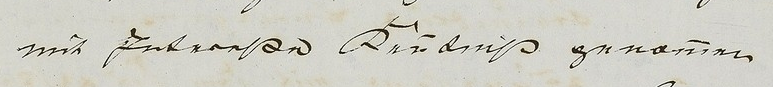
mit Intereße Kenntniß genommen
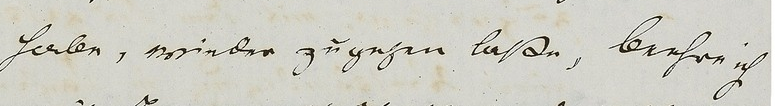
habe, wieder zugehen laße, beehre ich
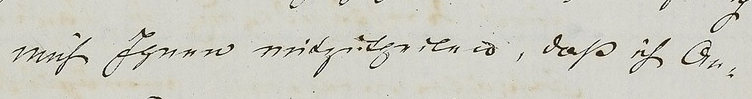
mich Ihnen mitzutheilen, daß ich An-
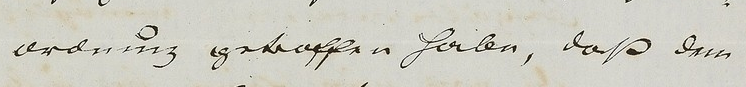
ordnung getroffen habe, daß dem
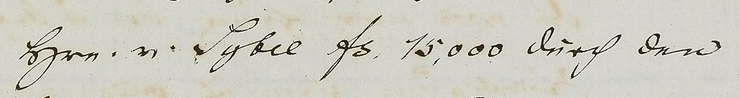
Hrn. v. Sybel fs. 15,000 durch den
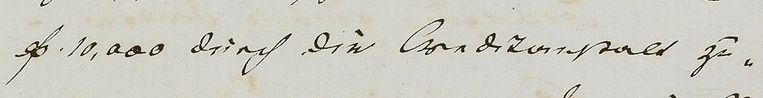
fs. 10,000 durch die Creditanstalt zu-
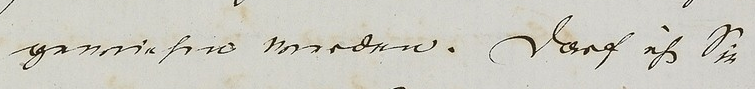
gewiesen werden. Darf ich Sie
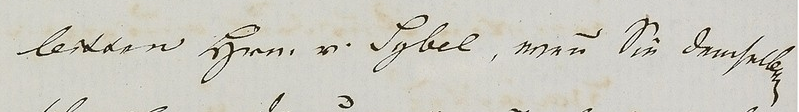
bitten Hrn. v. Sybel, wenn Sie demselben
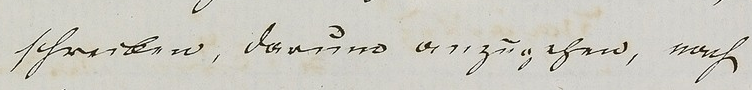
schreiben, darum anzugehen, nach
